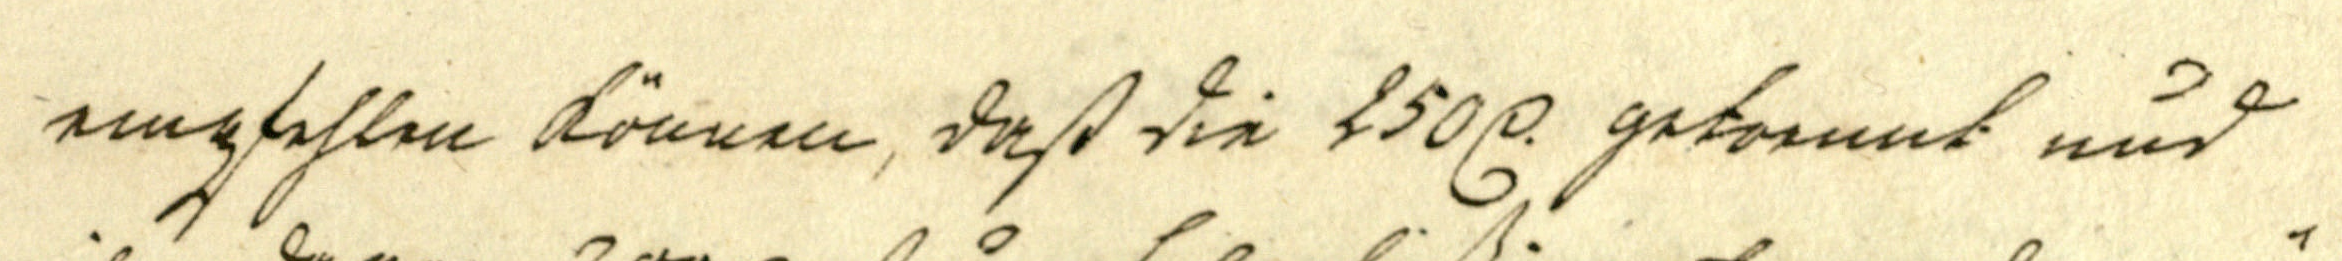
empfehlen können, daß die 250 l. getrennt und
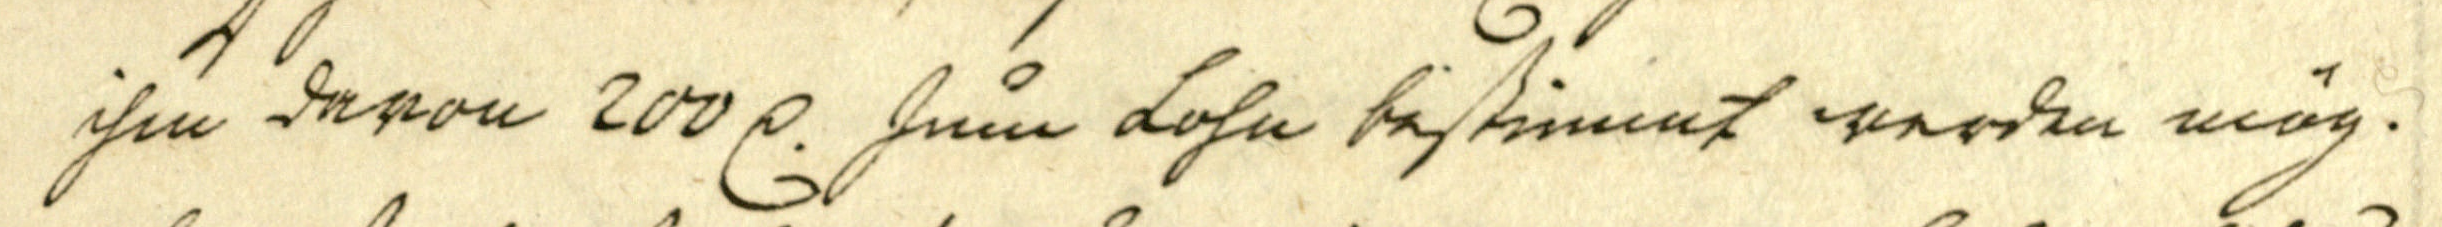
ihm davon 200 l. zum Lohn bestimmt werden mög¬
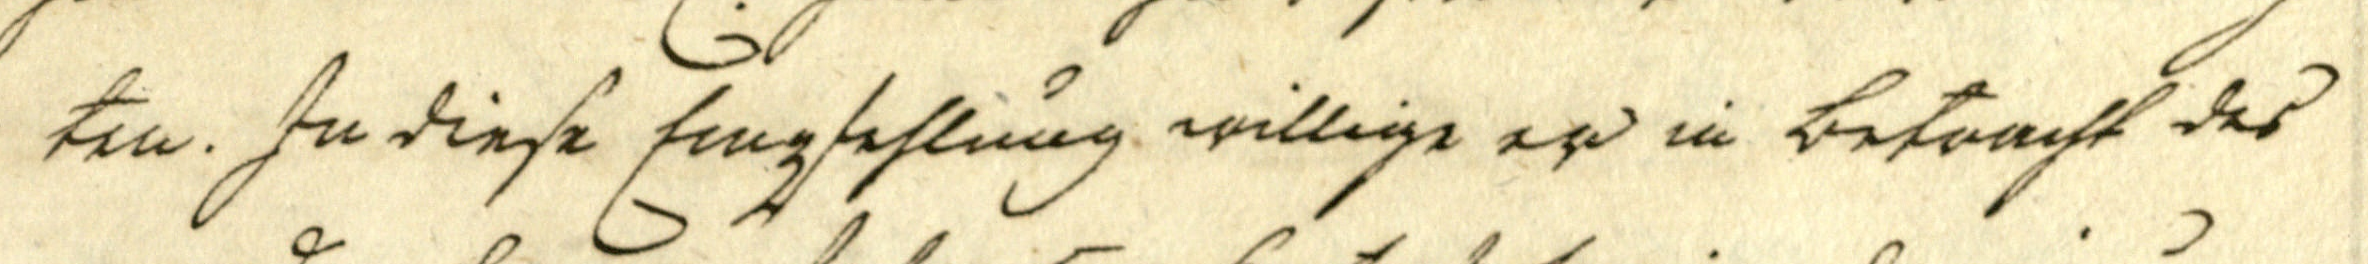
ten. In diese Empfehlung willige er in Betracht des
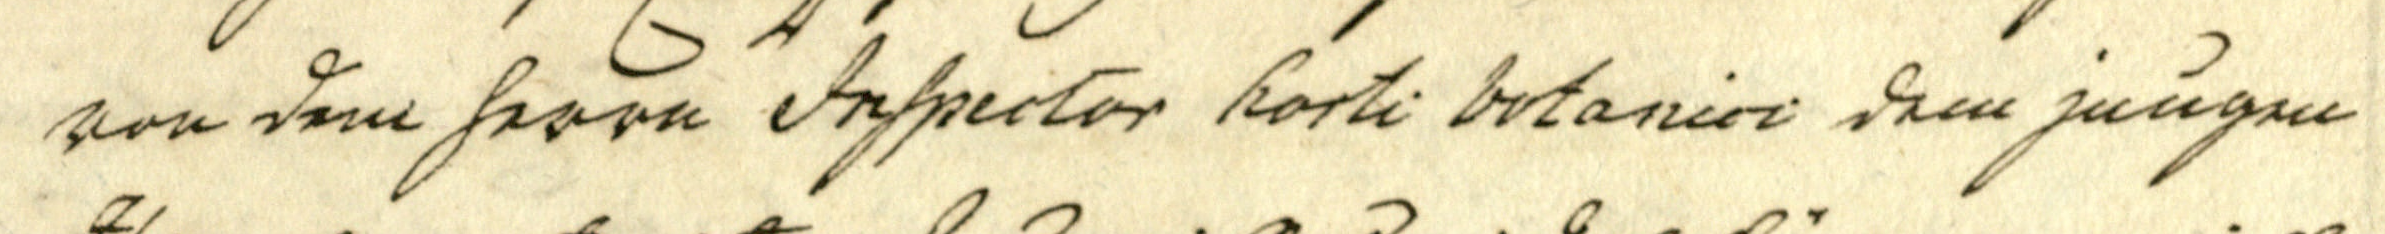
von dem Herrn Inspector horti botanici dem jungen
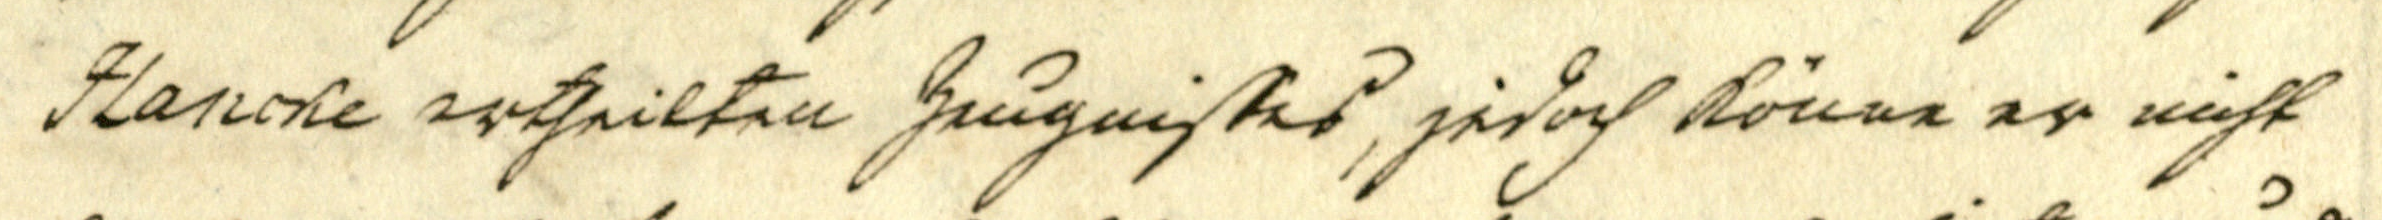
Hancke ertheilten Zeugnisses, jedoch könne er nicht
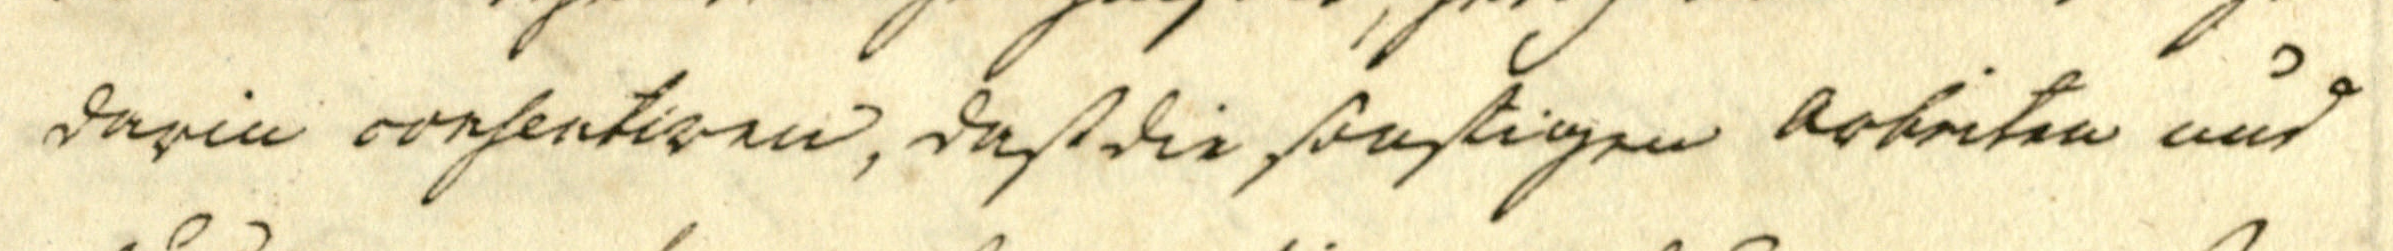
darin consentiren, daß die sonstigen Arbeiten und
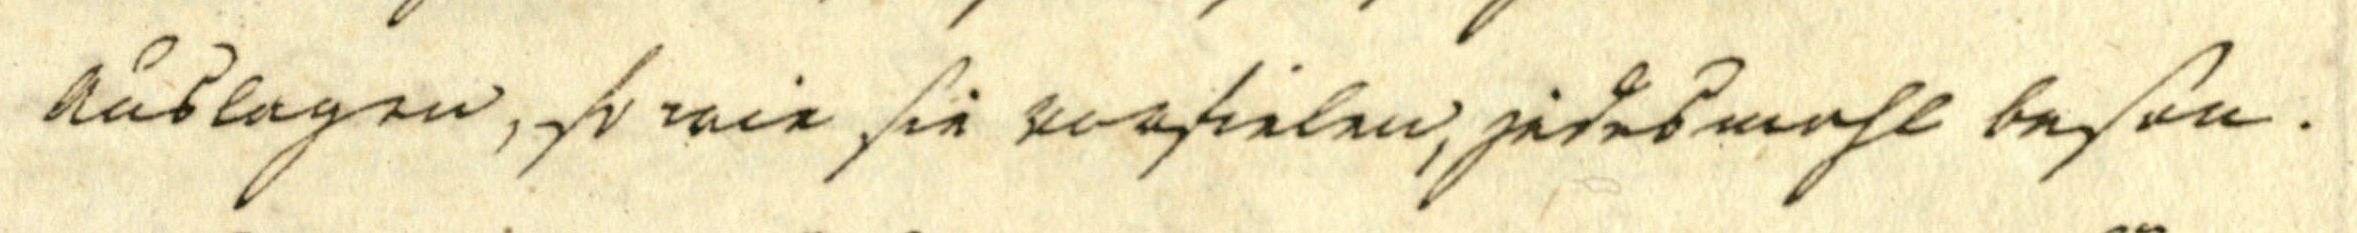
Auslagen, so wie sie vorfielen, jedesmahl beson¬
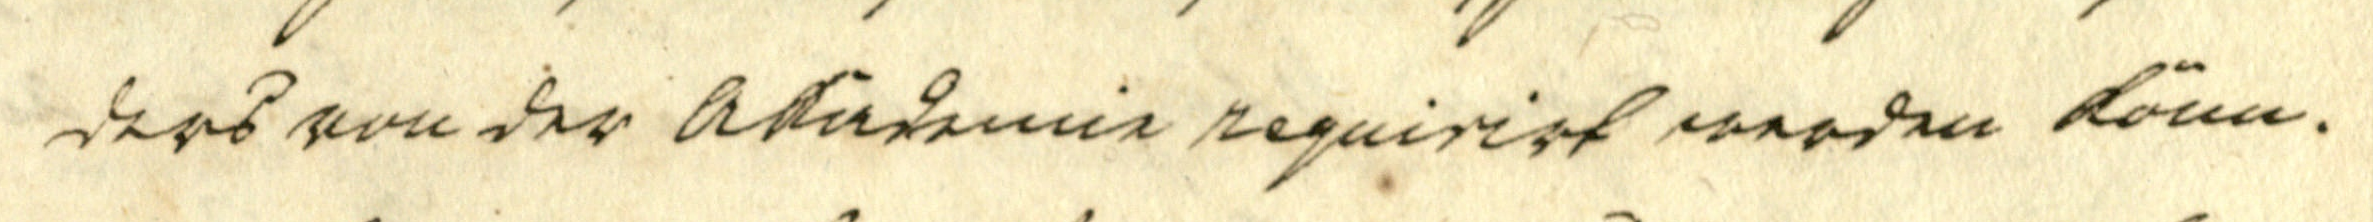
ders von der Akademie requirirt werden könn¬
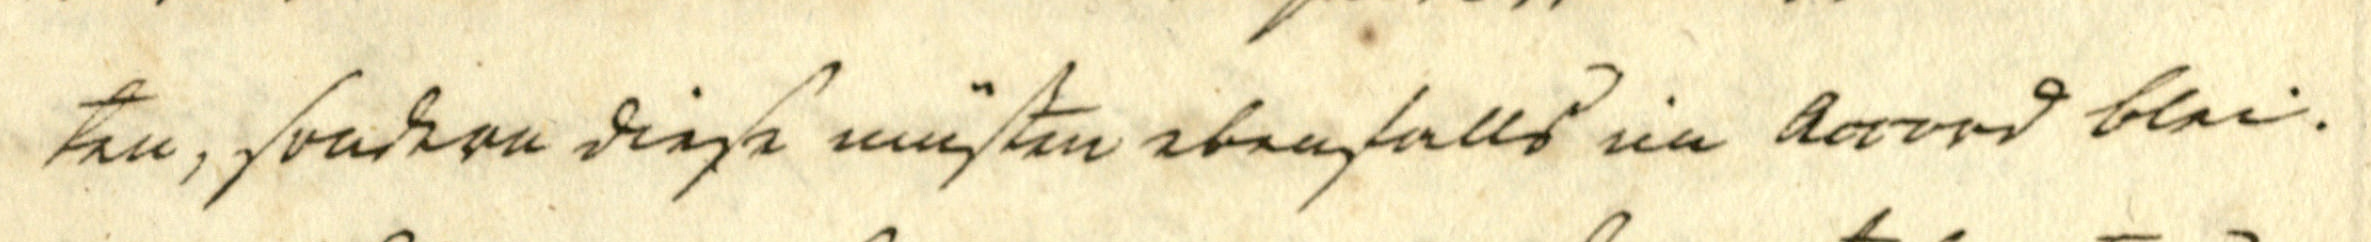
ten, sondern diese müßten ebenfalls im Accord blei¬
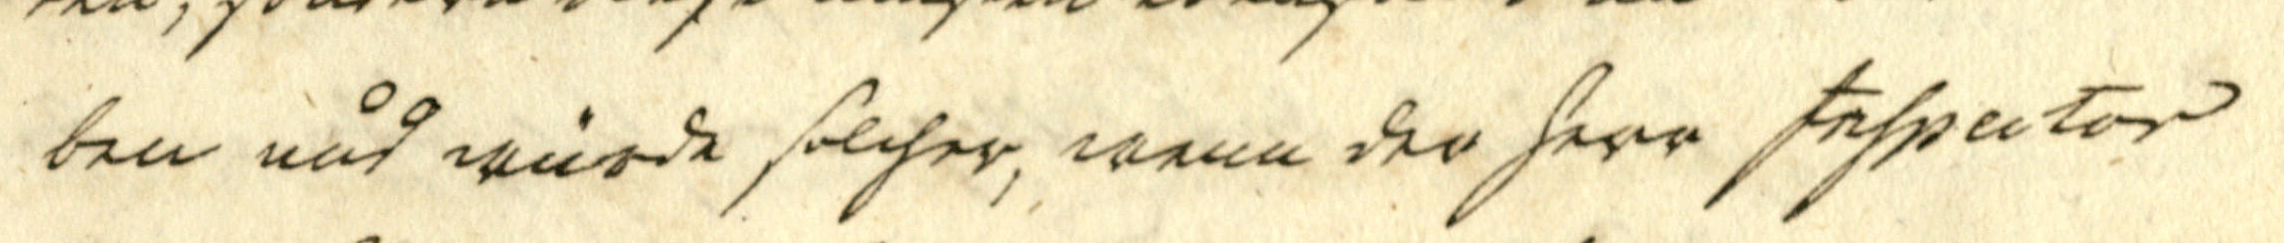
ben und würde solcher, wenn der Herr Inspector
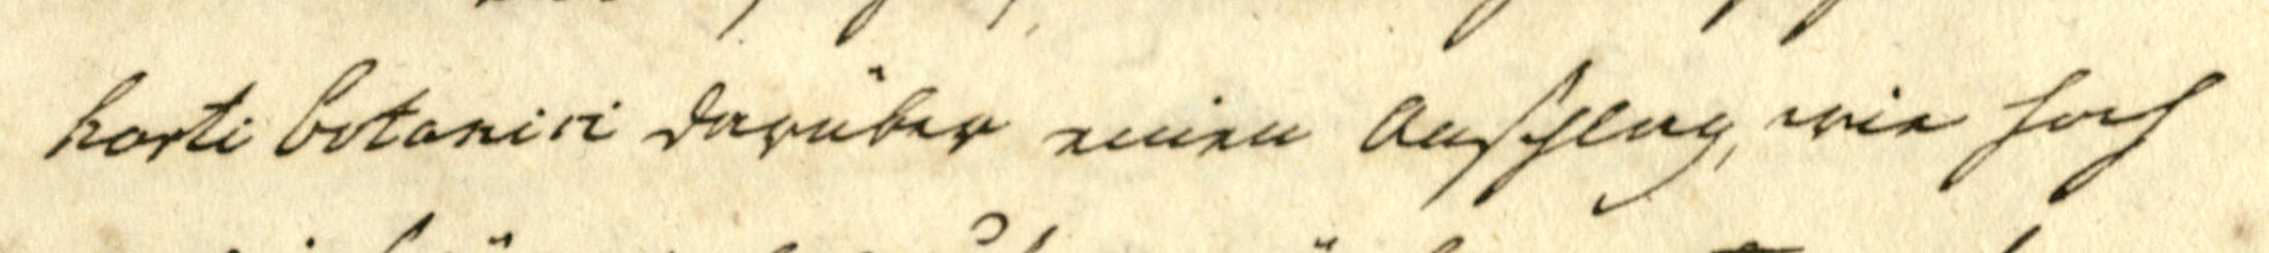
horti botanici darüber einen Anschlag, wie hoch
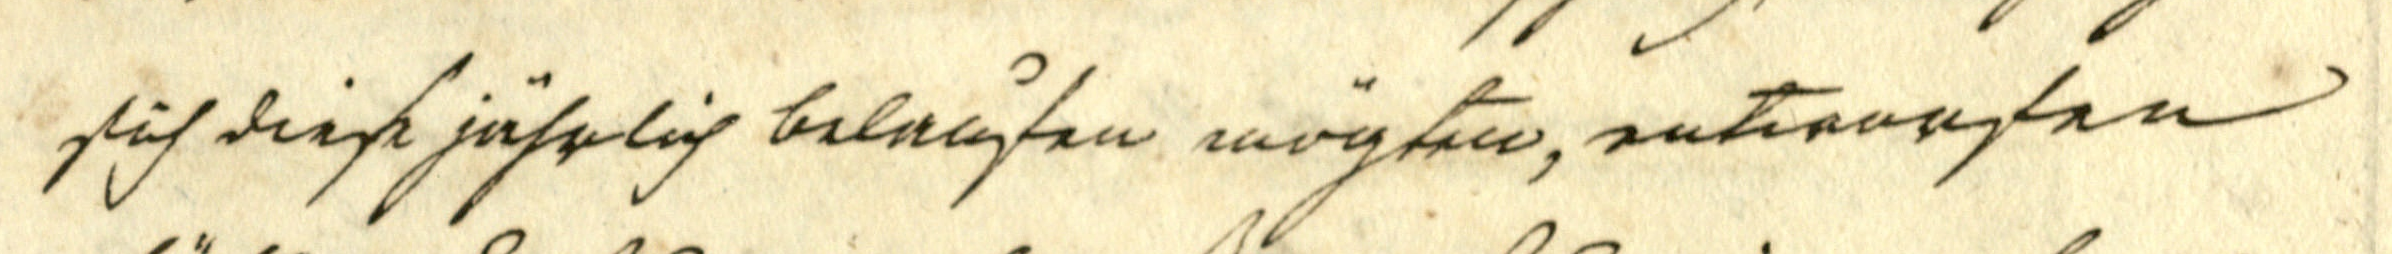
sich diese jährlich belaufen mögten, entworfen
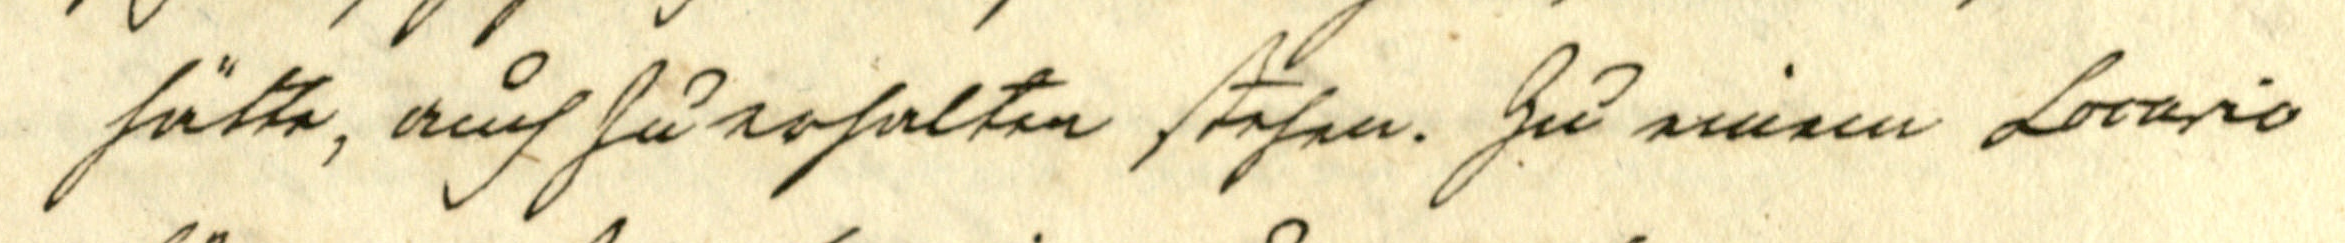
hätte, auch zu erhalten stehen. Zu einem Locario
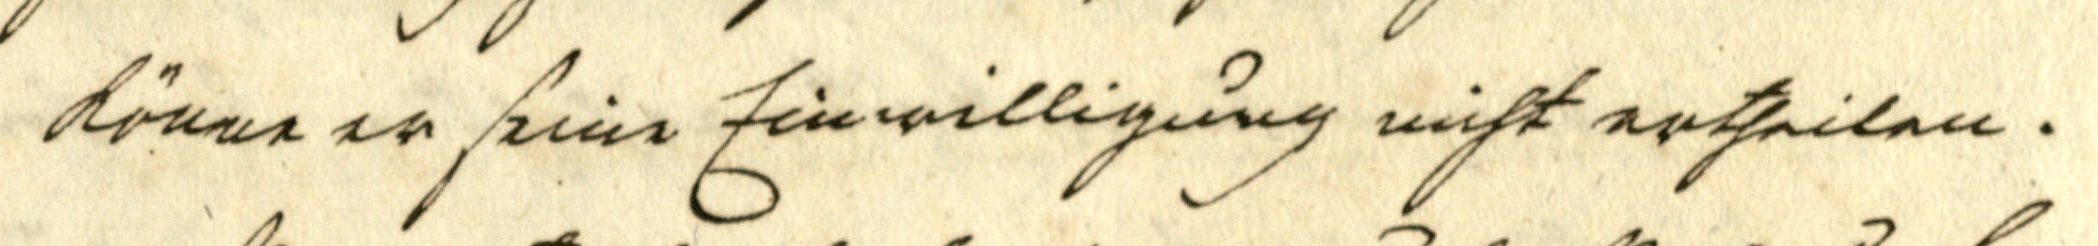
könne er seine Einwilligung nicht ertheilen.
